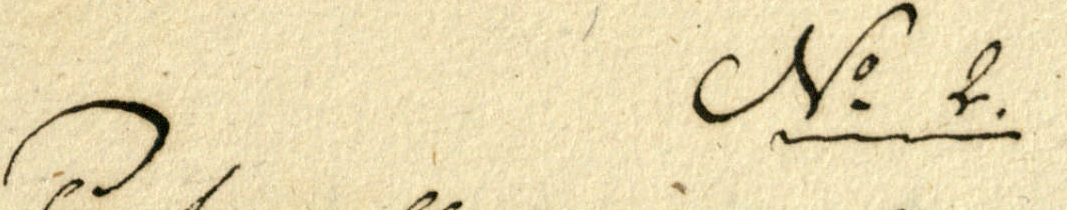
Nº 2.
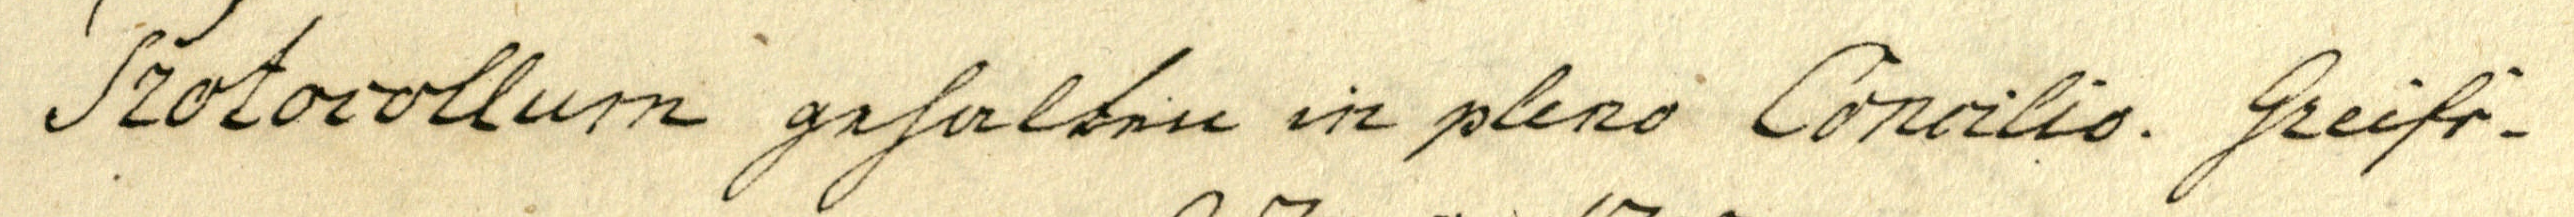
Protocollum gehalten in pleno Concilio. Greifs¬
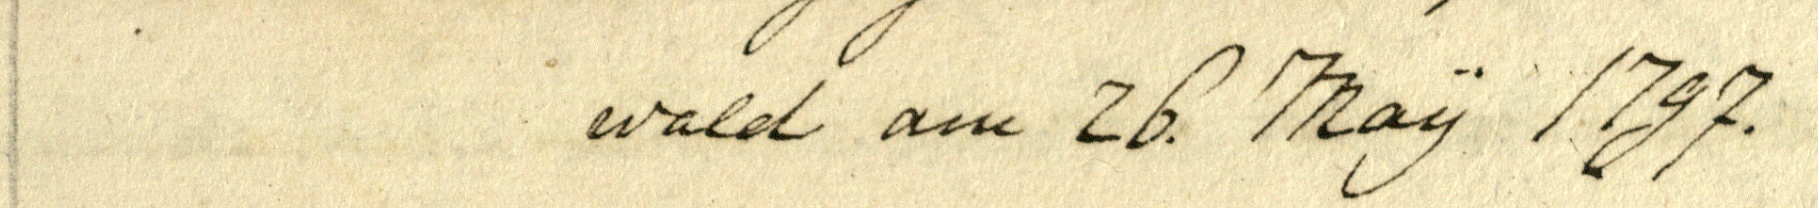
wald am 26. Maÿ 1797.
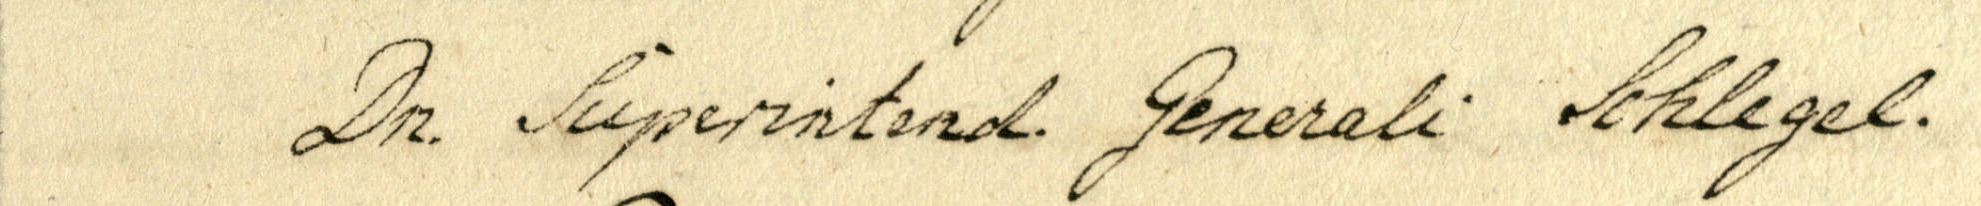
Dn. Superintend. Generali Schlegel.
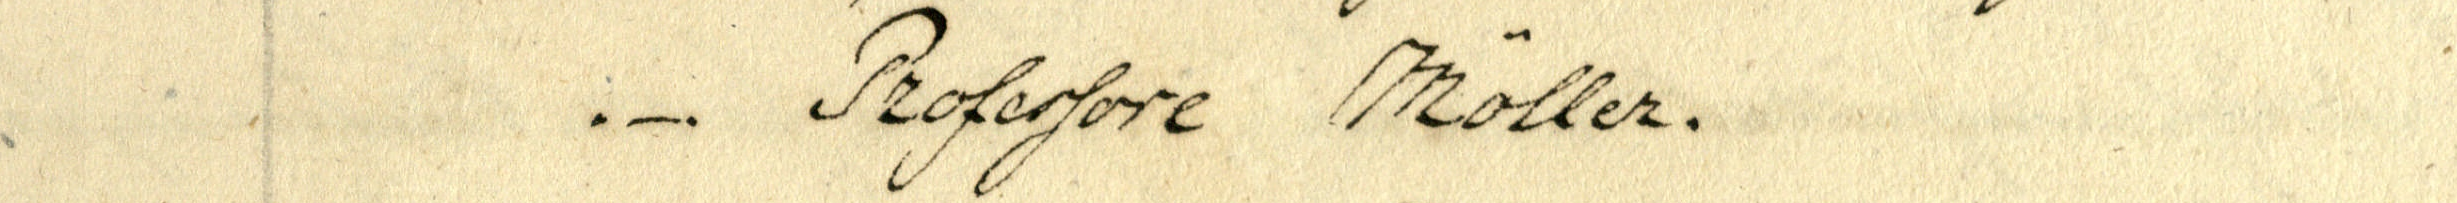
Professore Möller.
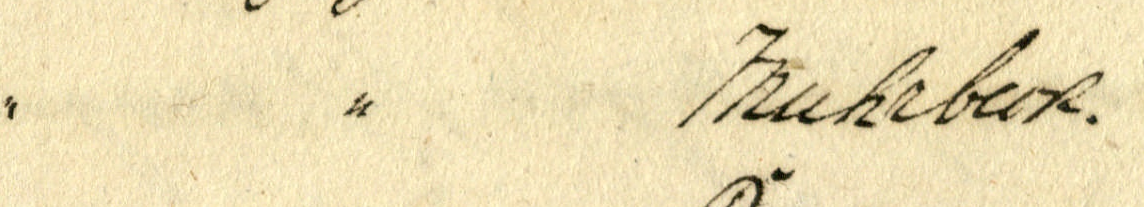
Muhrbeck.
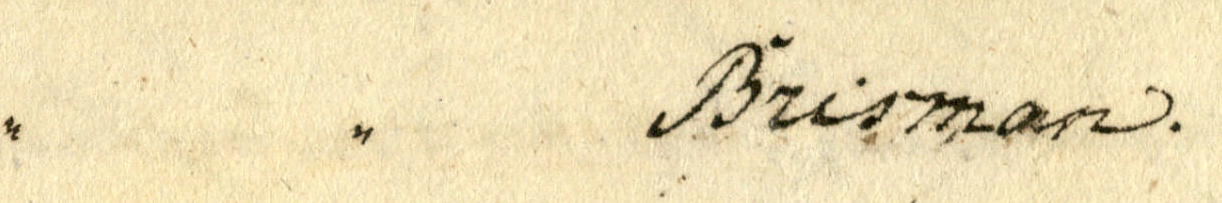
Brisman.
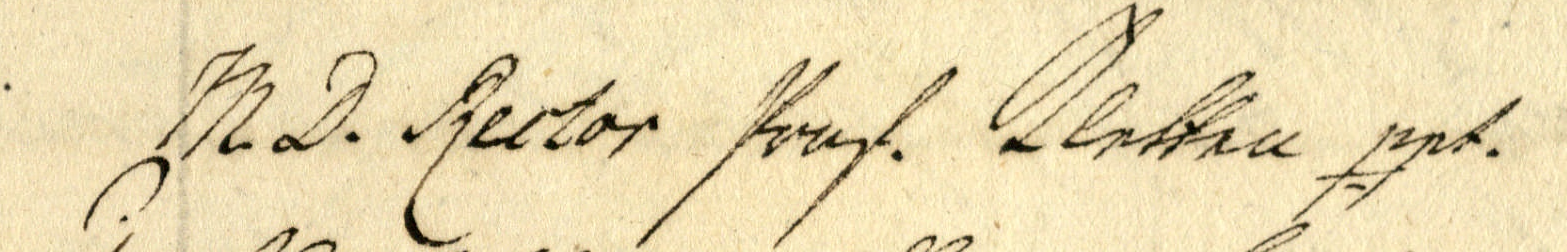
M. D. Rector Prof. Kletten ppt.
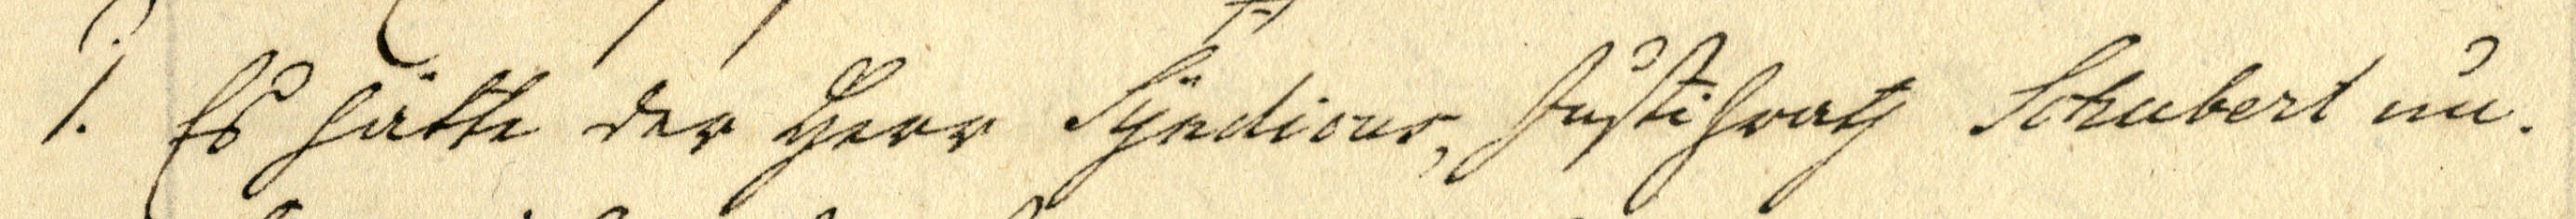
1. Es hätte der Herr Sÿndicus, Justizrath Schubert un¬
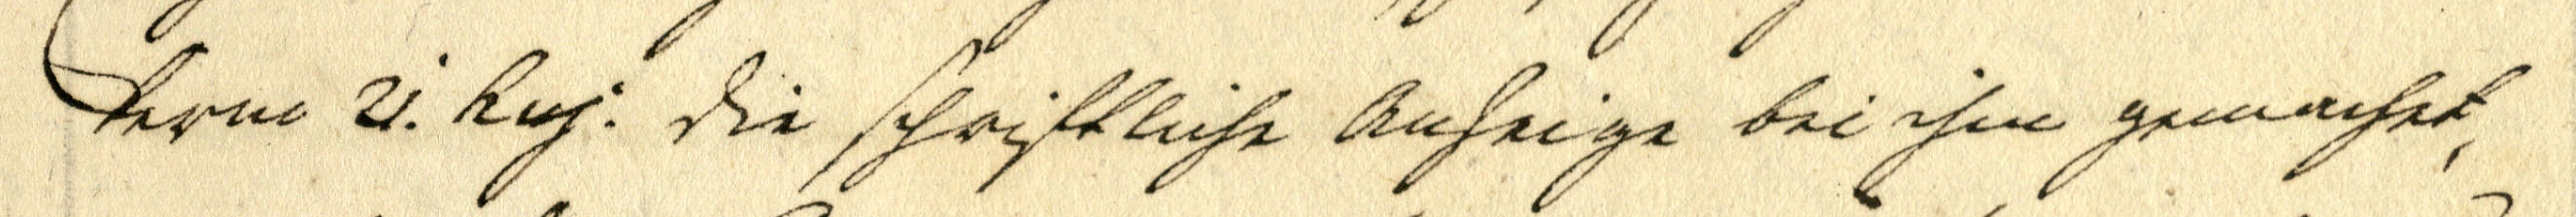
term 21. huj. die schriftliche Anzeige bei ihm gemachet,
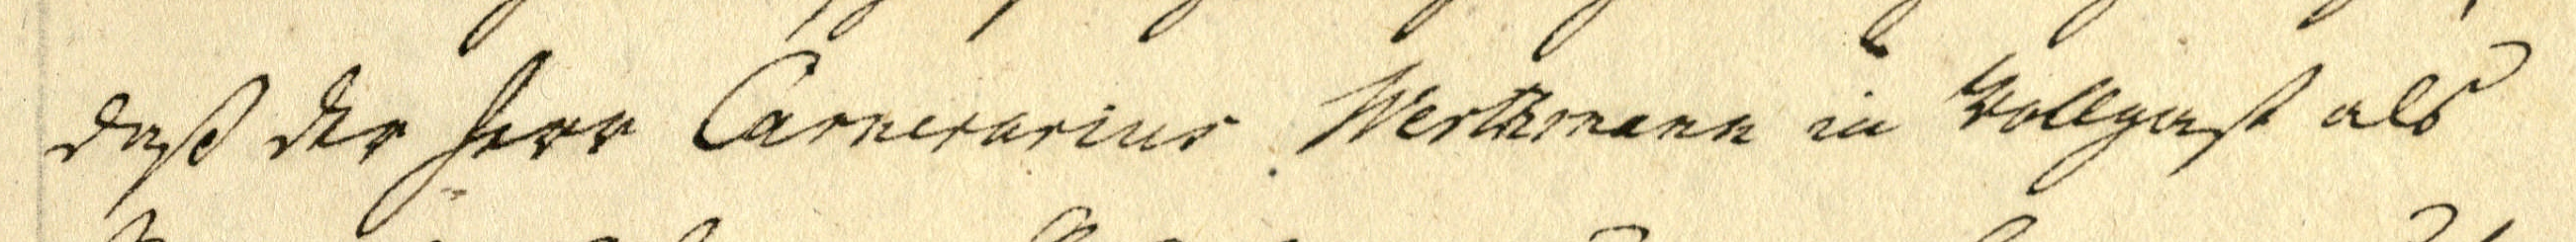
daß der herr Camerarius Werthmann in Wollgast als
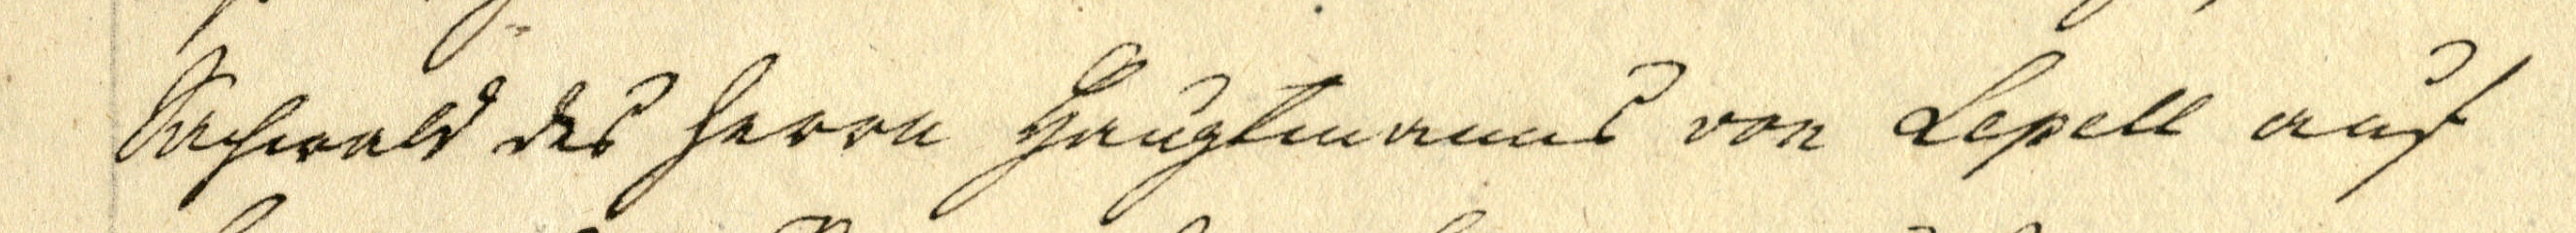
Sachwald des herrn Hauptmanns von Lepell auf
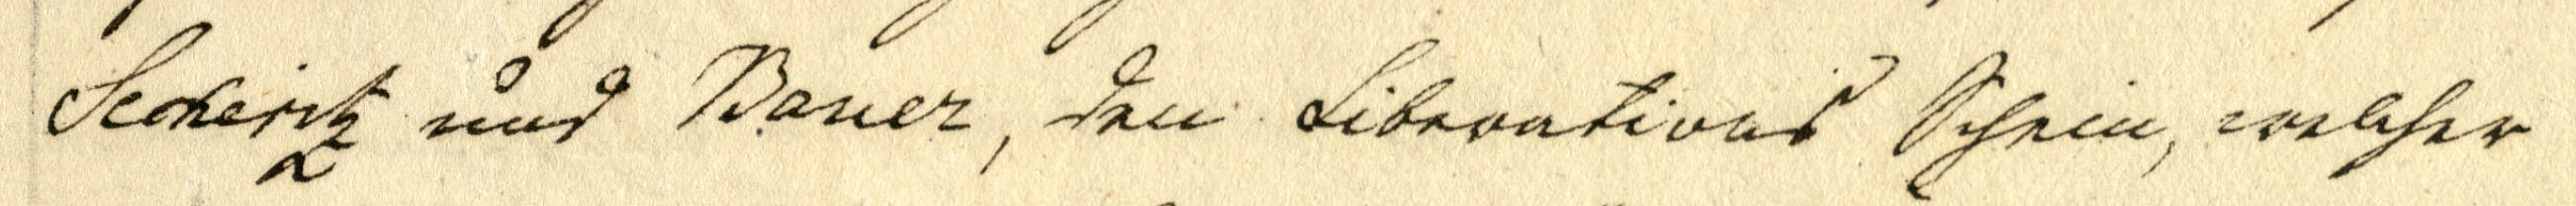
Seckeritz und Bauer, den Liberations Schein, welcher
